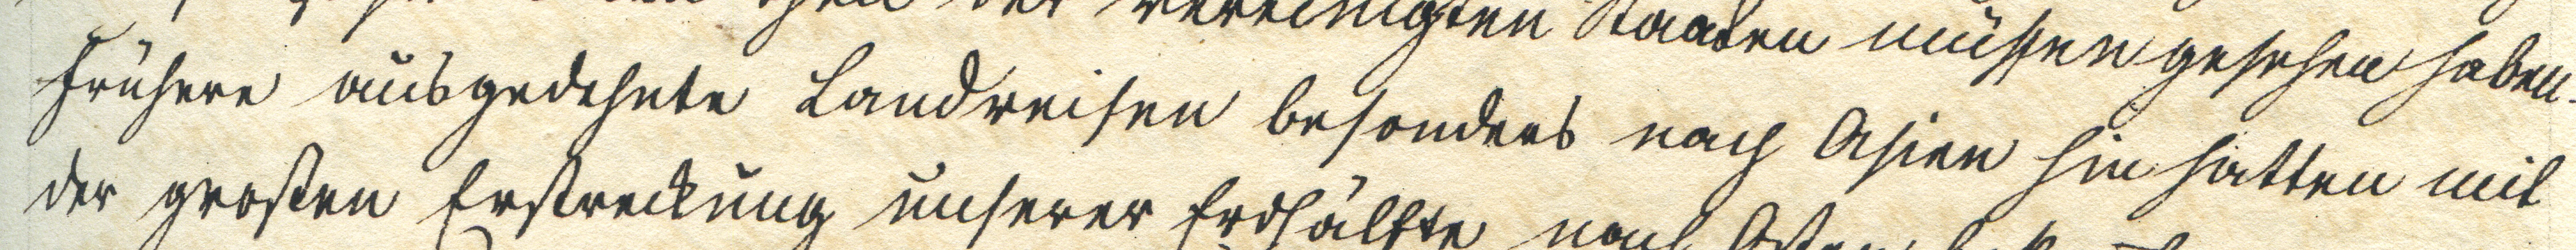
Frühere ausgedehnte Landreisen besonders nach Asien hin, hatten mit
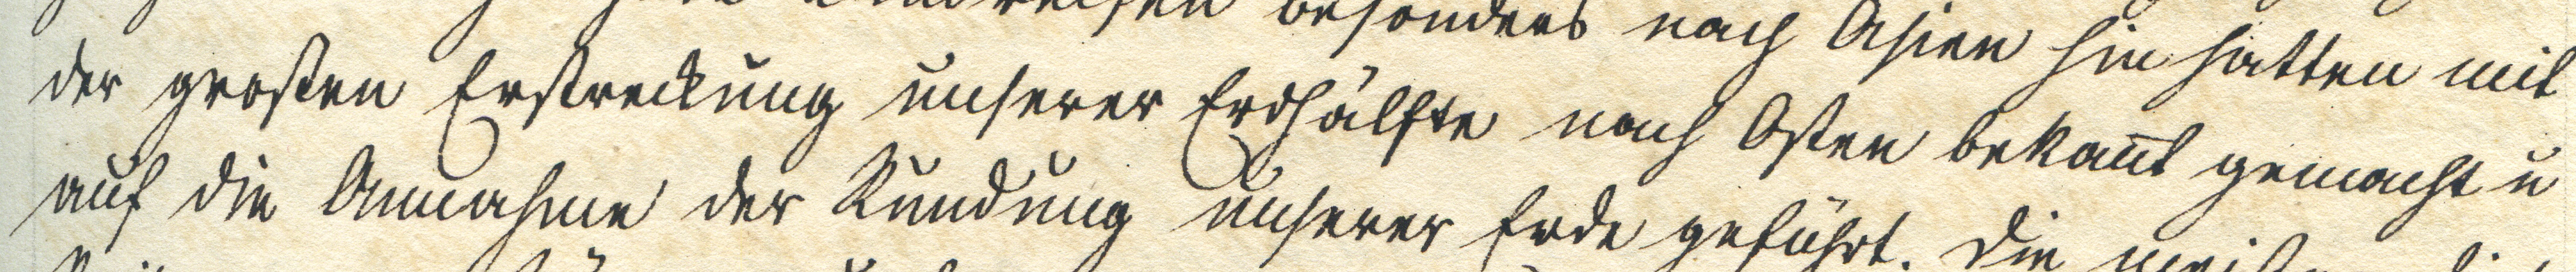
der großen Erstreckung unserer Erdhälfte nach Osten bekañt gemacht u
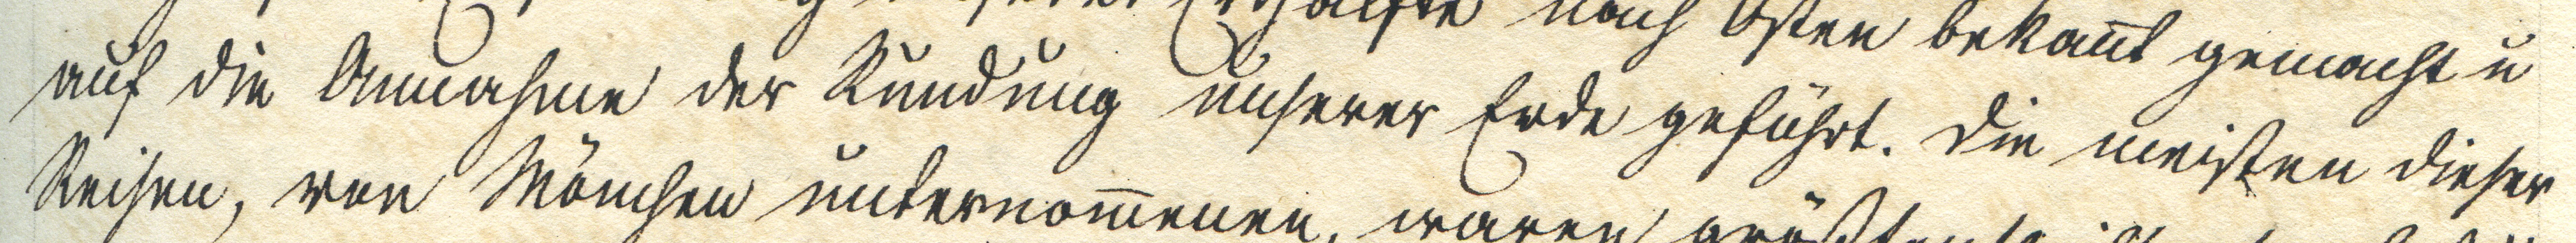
auf die Annahme der Rundung unserer Erde geführt. Die meisten dieser
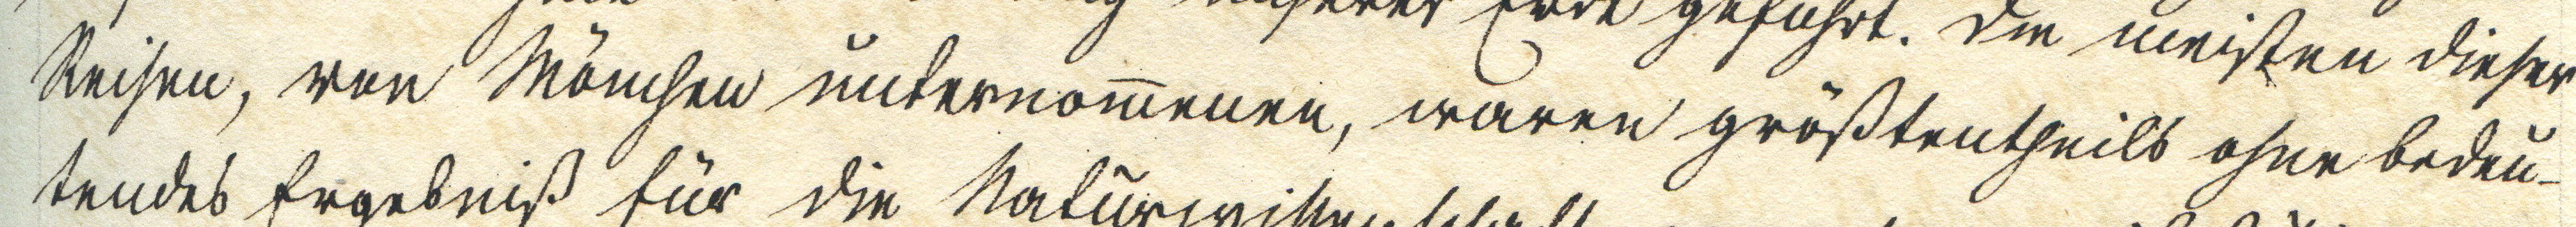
Reisen, von Mönchen unternom̃en, waren größtentheils ohne bedeu-
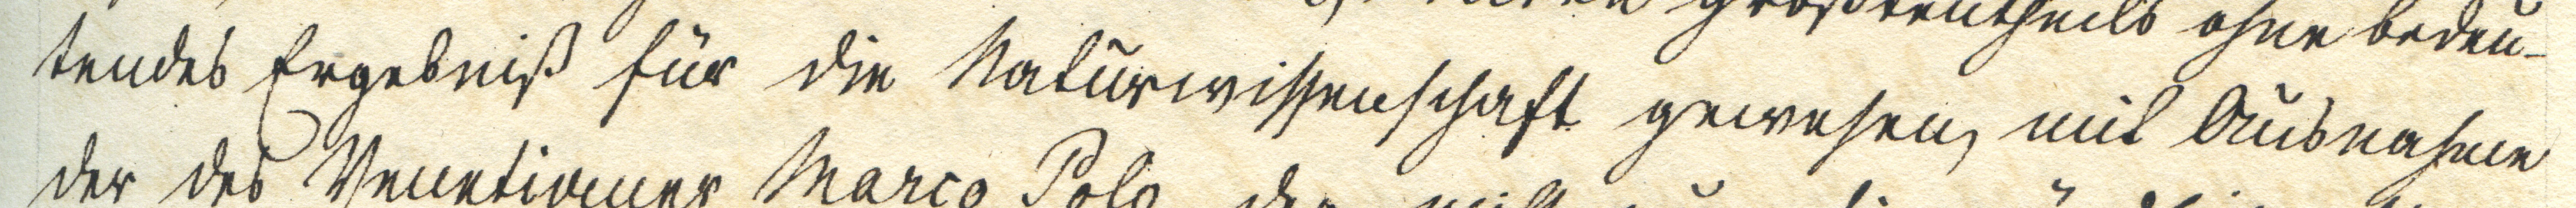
tendes Ergebniß für die Naturwissenschaft gewesen, mit Ausnahme
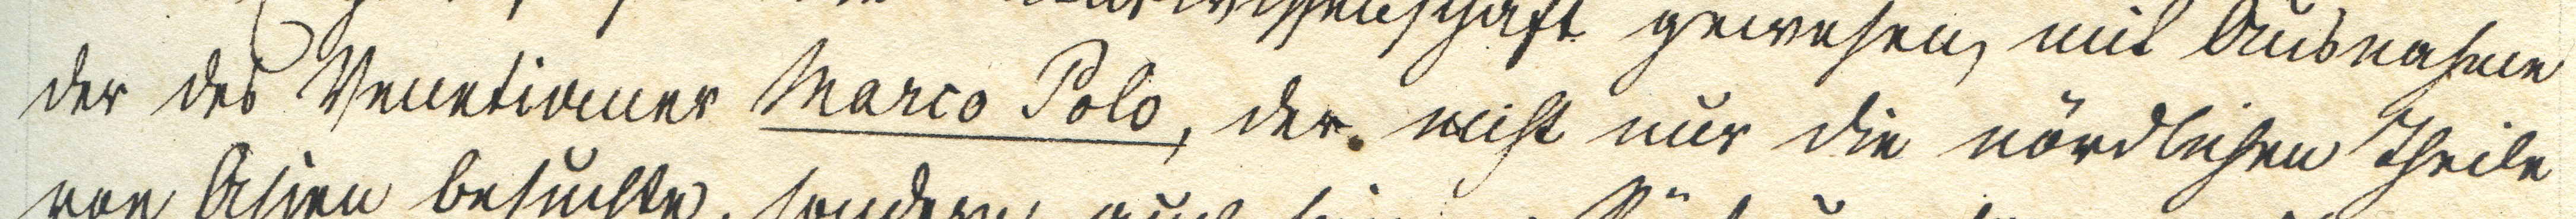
der des Venetianers Marco Polo, der nicht nur die nördlichen Theile
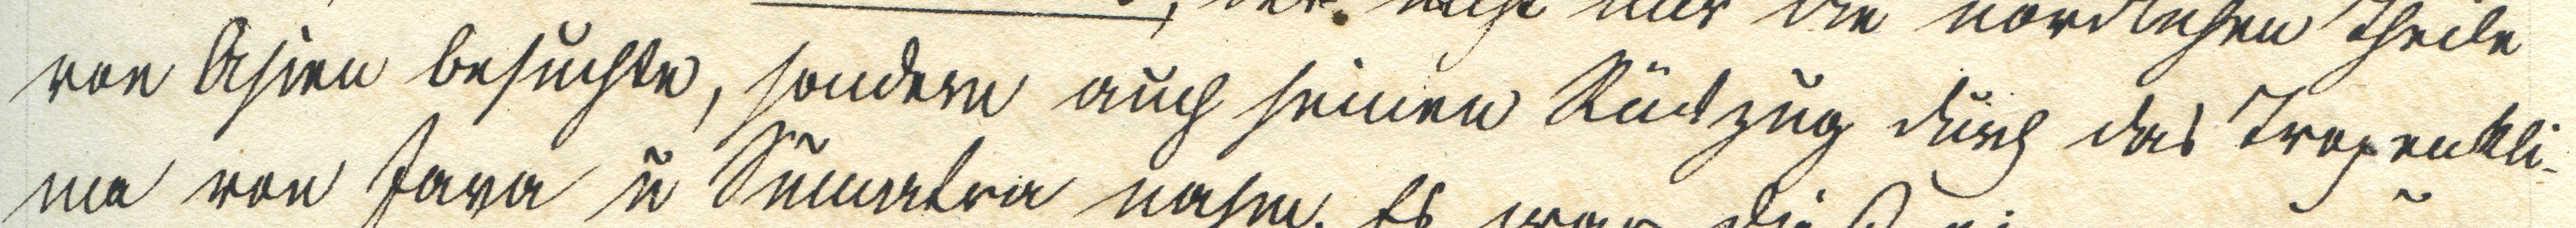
von Asien bereiste, sondern auch seinen Rückzug durch das Tropenkli-
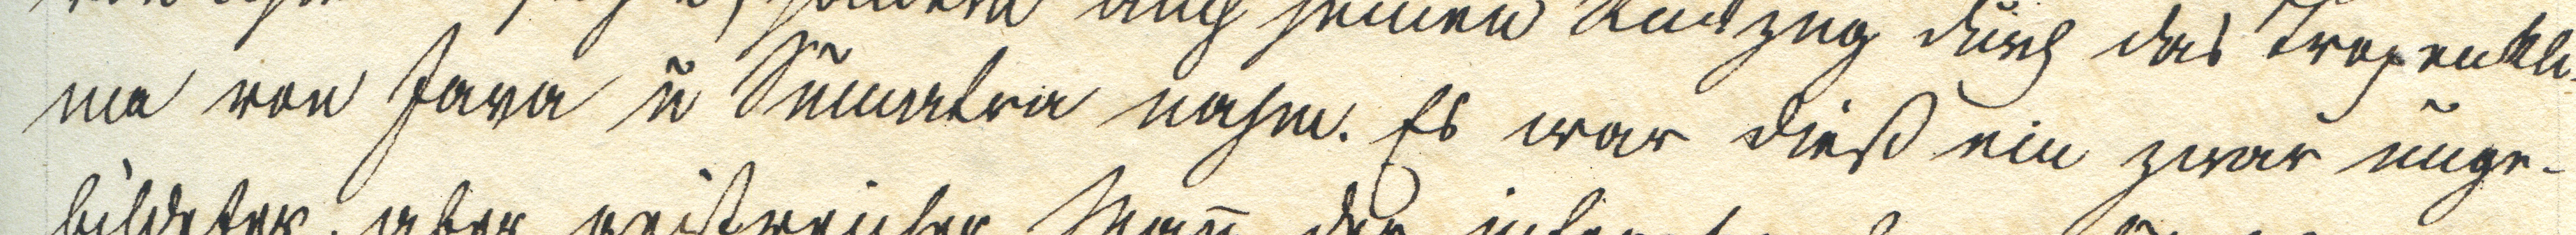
ma von Jawa u Sumatra nahm. Es war dieß ein zuvor unge-
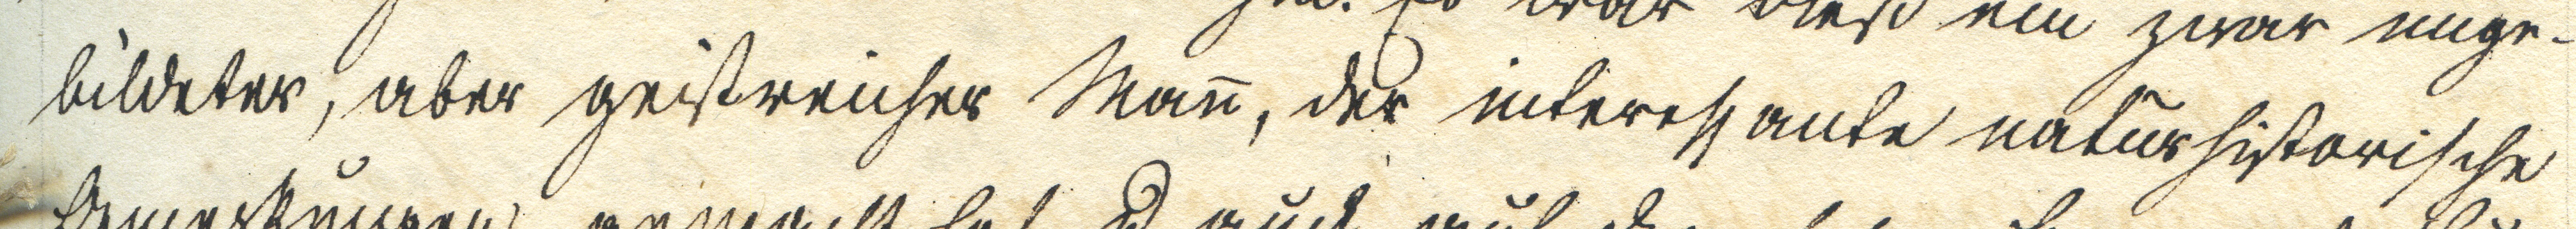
bildeter, aber geistreicher Mañ, der interessante naturhistorische
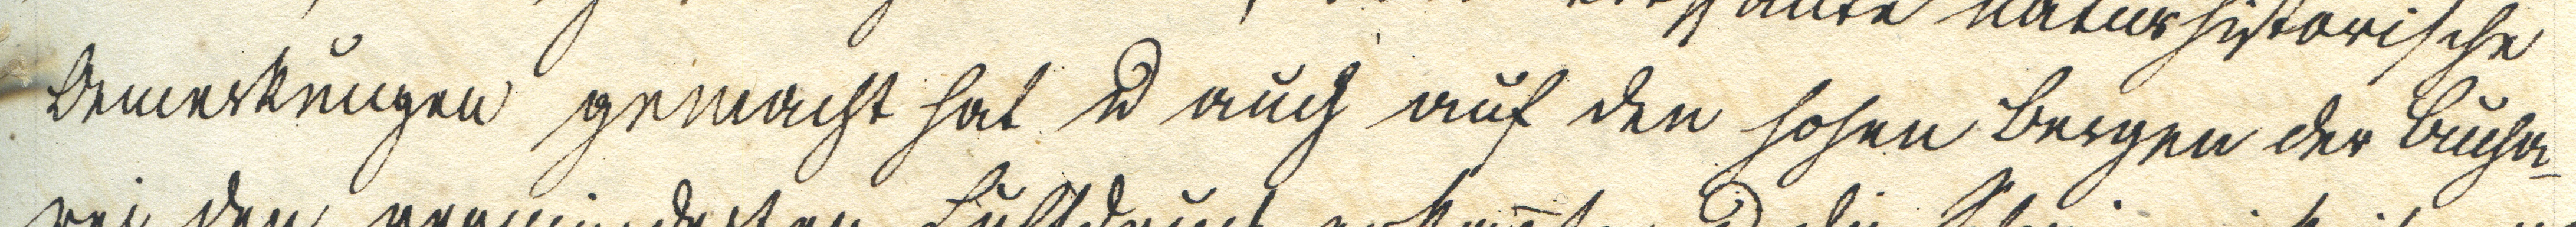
Bemerkungen gemacht hat u auch auf den hohen Bergen der Bucha-
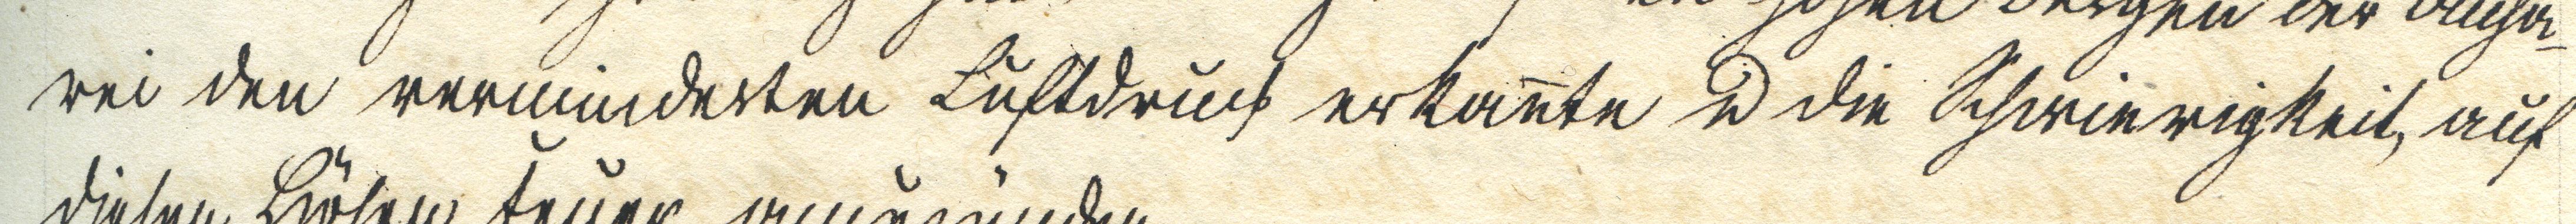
rei den verminderten Luftdruck erkañte u die Schwierigkeit, auf
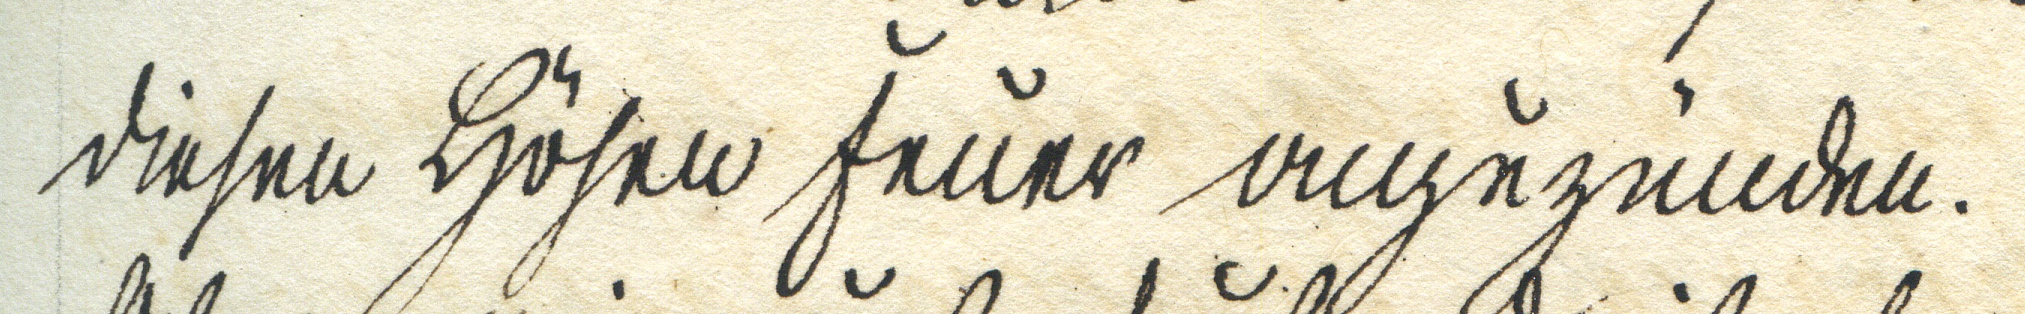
diesen Höhen Feuer anzuzünden.
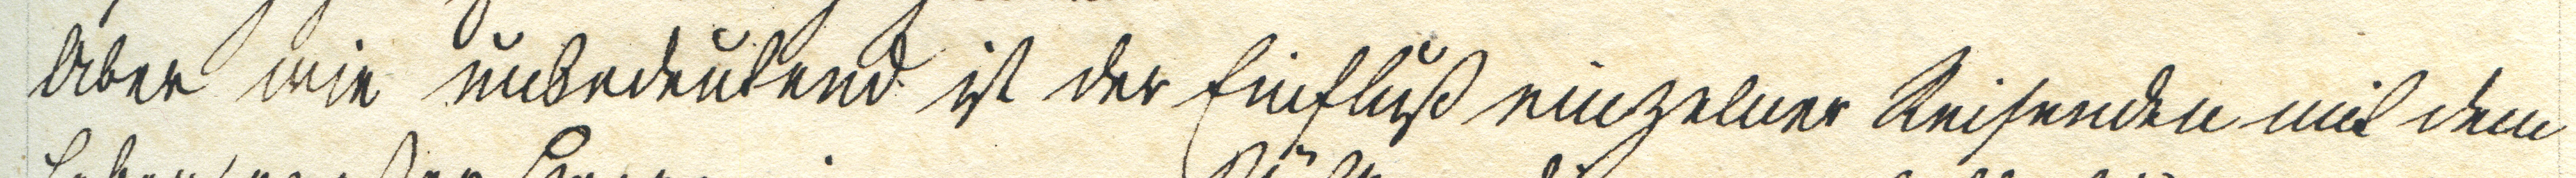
Aber wie unbedeutend ist der Einfluß einzelner Reisenden mit dem
